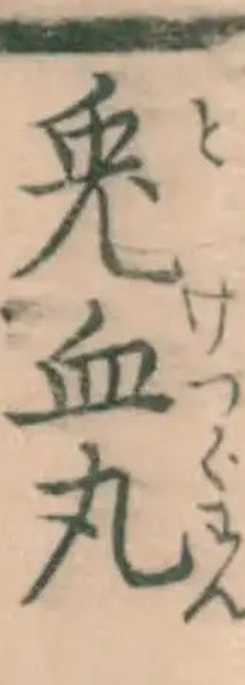兎血丸
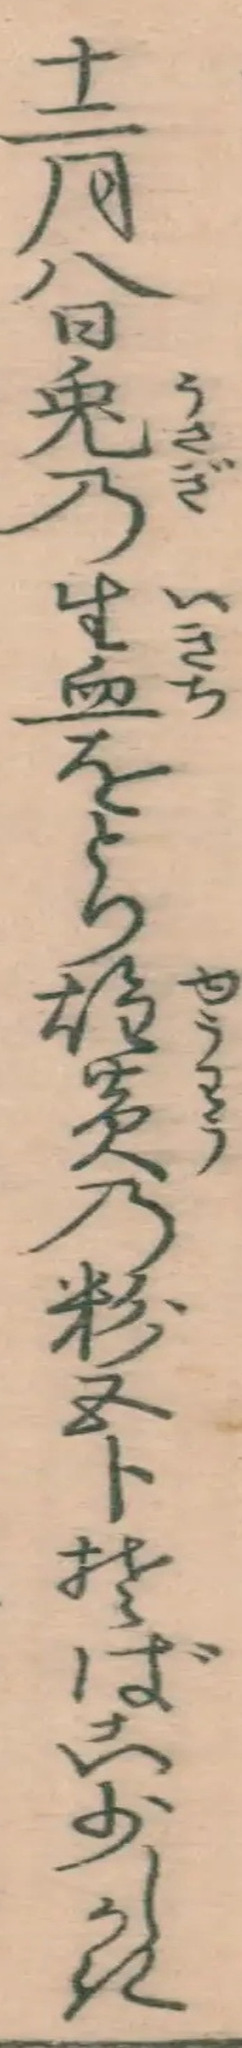十二月八日兎の生血をとり雄黄の粉五分そばこ少しかき
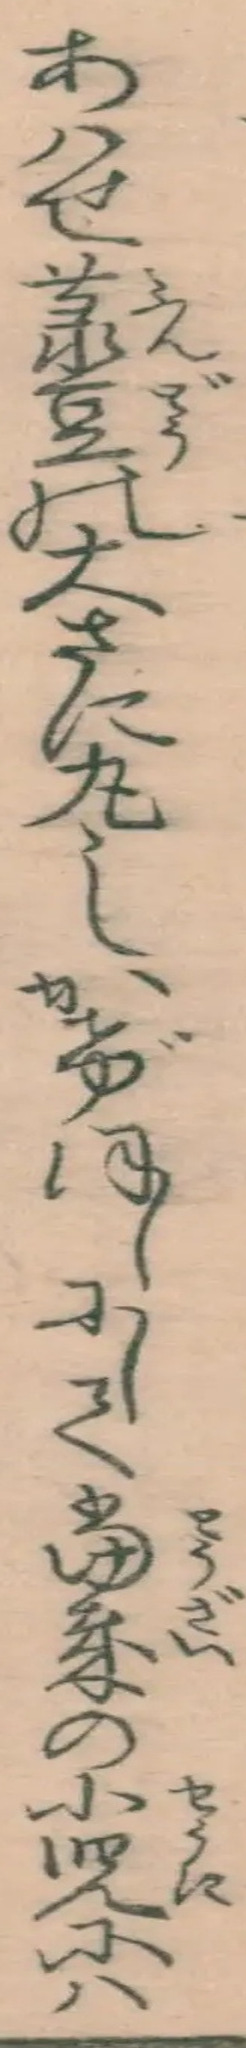あはせ菉豆の大さに丸しかげほしにして当歳の小児には
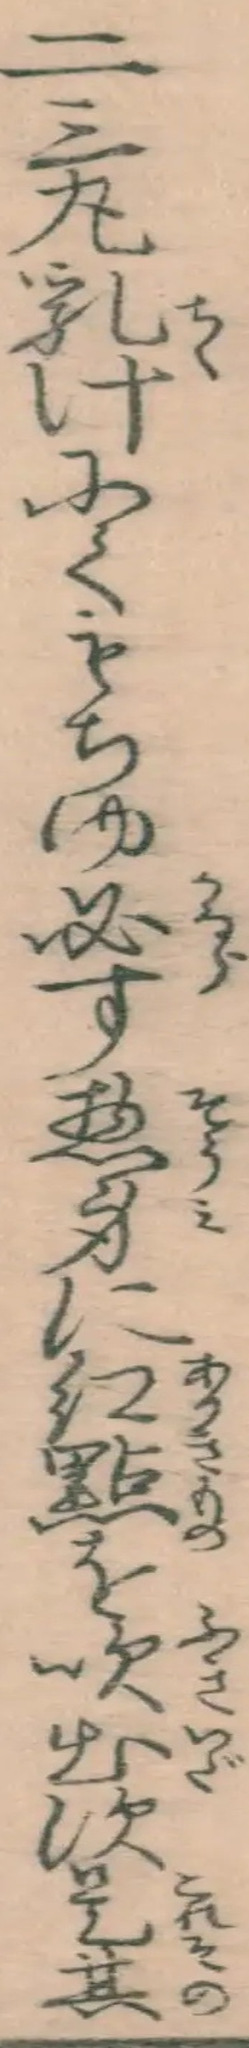二三丸乳汁にてもちゆ必す惣身に紅点を吹出す是其
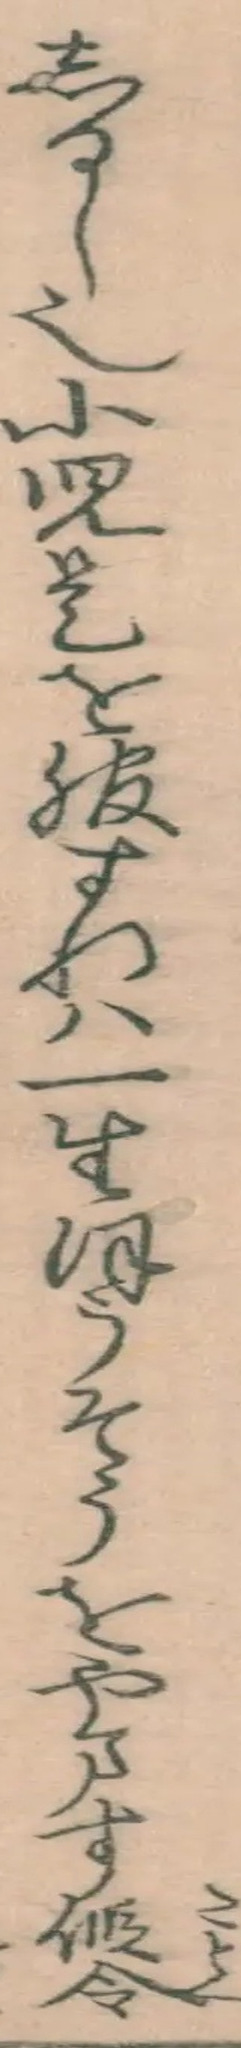しるし也小児是を服すれは一生ほうそうをやます仮令
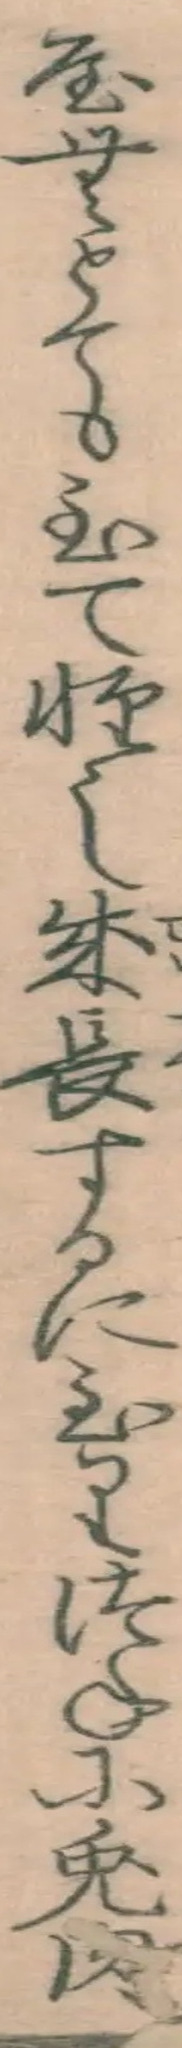やむとても至て軽し歳長するに至りつねに兎肉

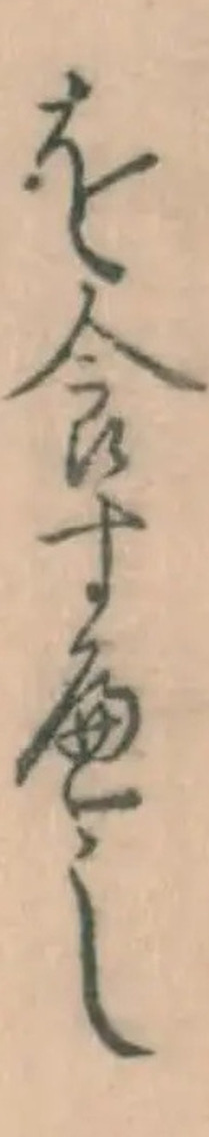を食すへし
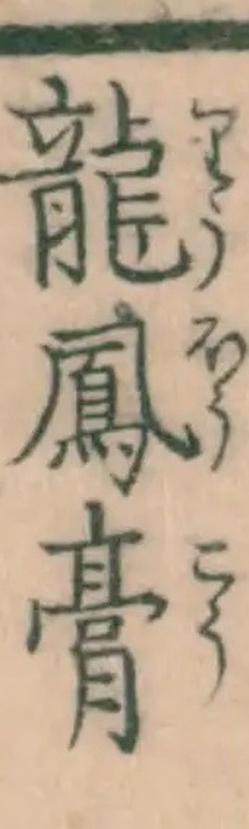竜鳳膏
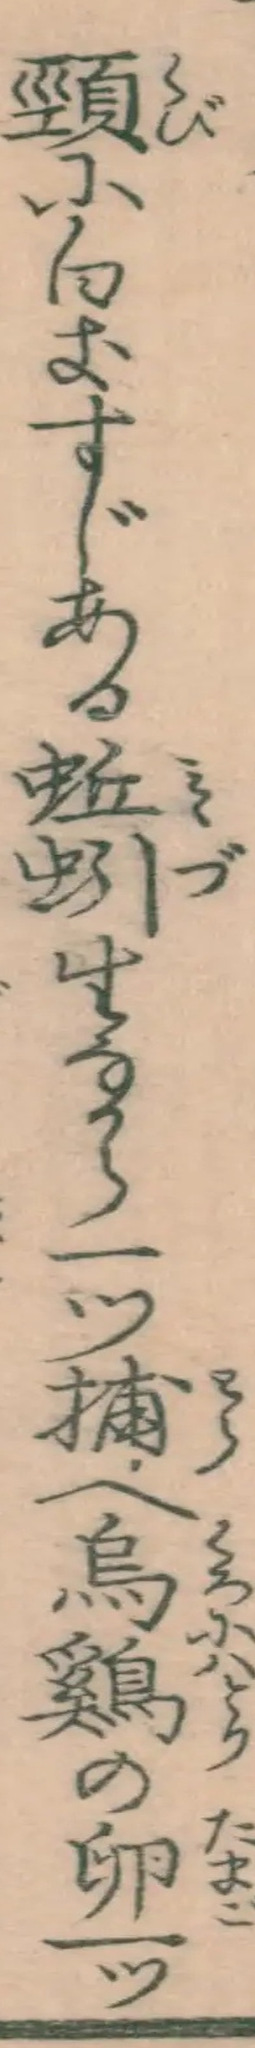頸に白きすじある蚯蚓生なから一ツ捕へ烏鷄の卵一ツ
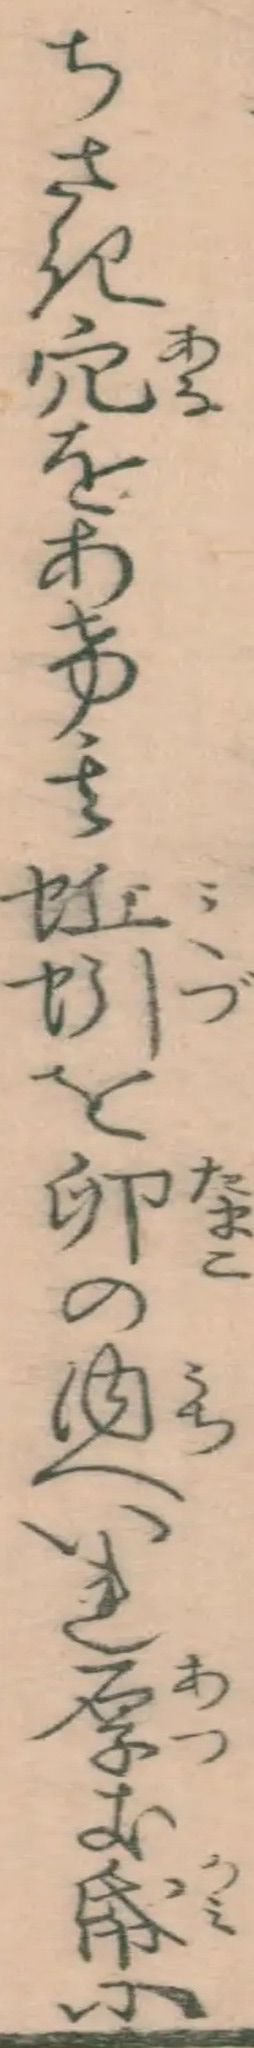ちさき穴をあけ其蚯蚓を卵の内へいれ厚き紙に
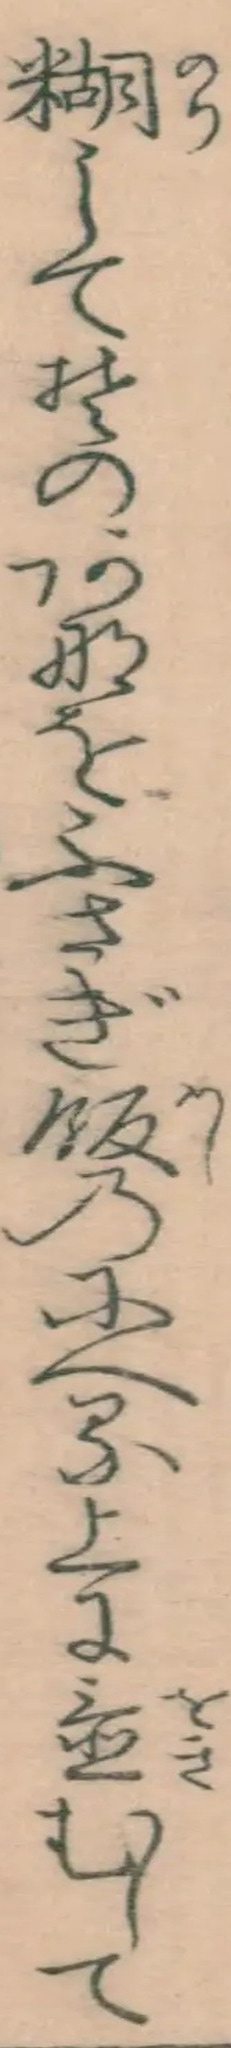糊してそのあなをふさぎ飯のにへる上に置むして
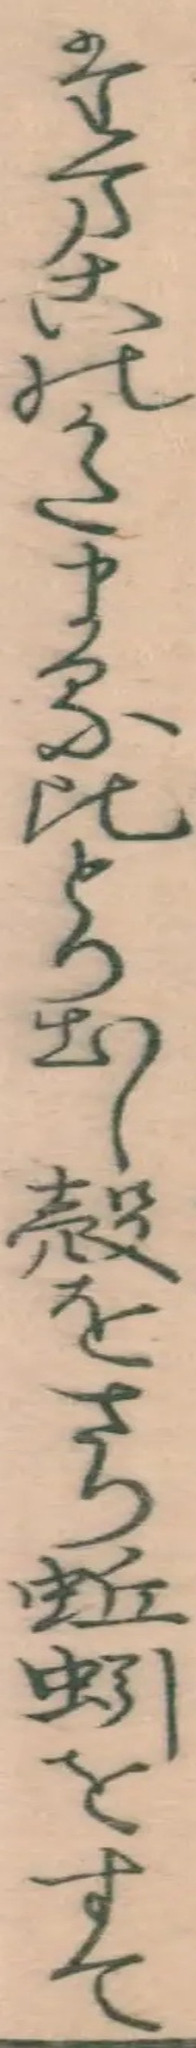たまこのかたまる比とり出し殻をさり蚯蚓をすて
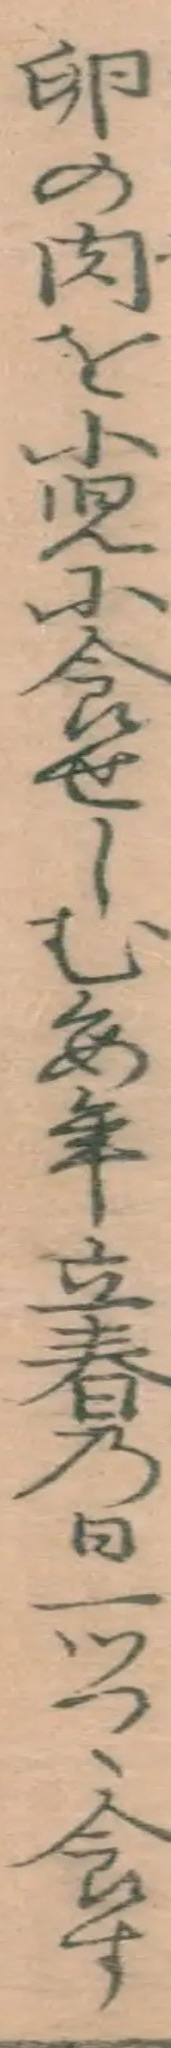卵の肉を小児に食せしむ毎年立春の日一ツつゝ食す
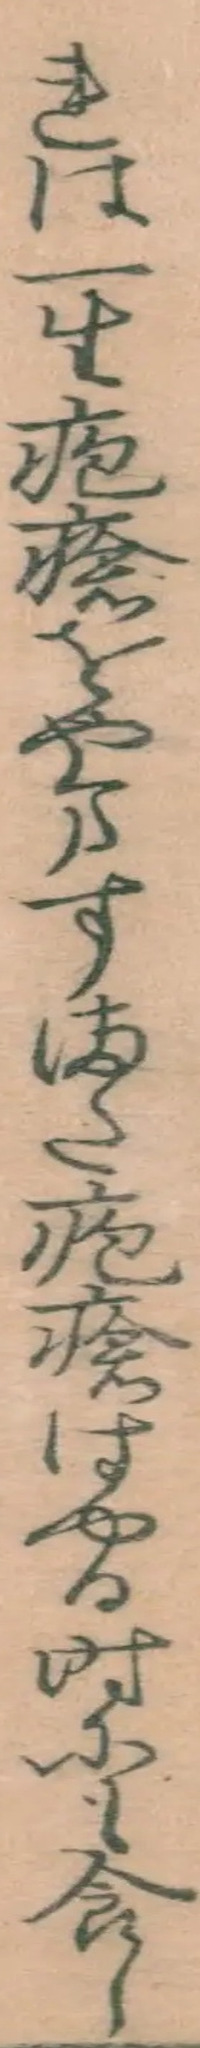れは一生疱瘡をやますまた疱瘡はゆる時にも食し
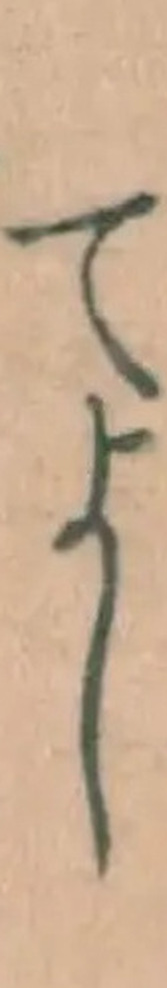てよし
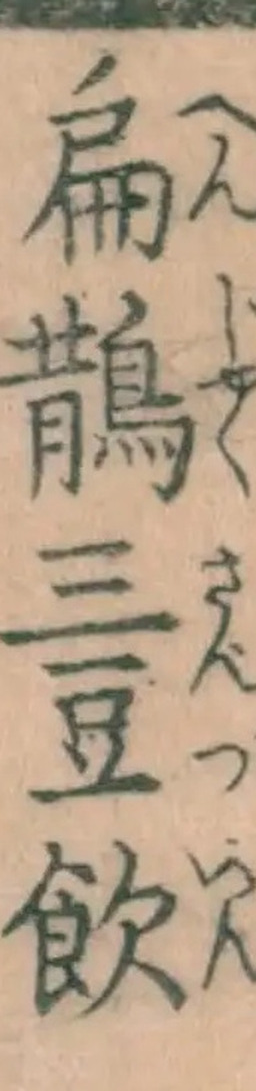扁鵲三豆飲
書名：雨夜談
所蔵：国立国会図書館 National Diet Library, JAPAN
